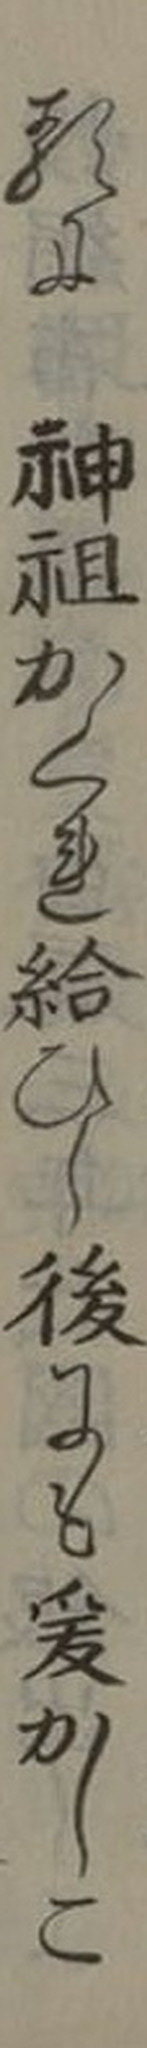るに神祖かくれ給ひし後にも爰かしこ
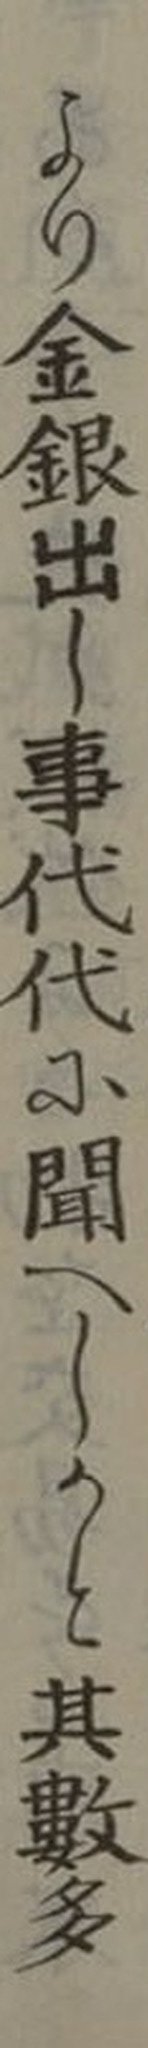より金銀出し事代代に聞へしかと其數多
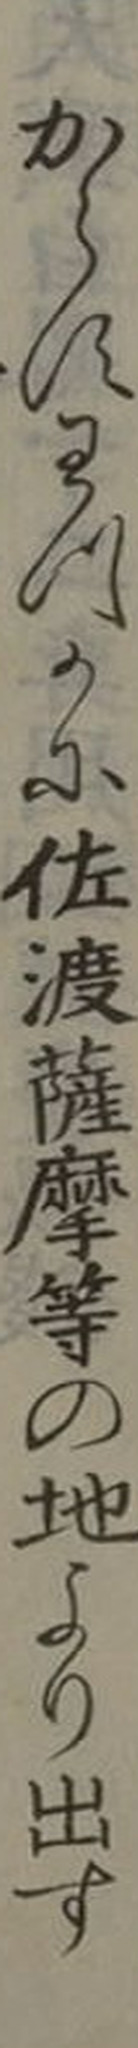からすわつかに佐渡薩摩等の地より出す
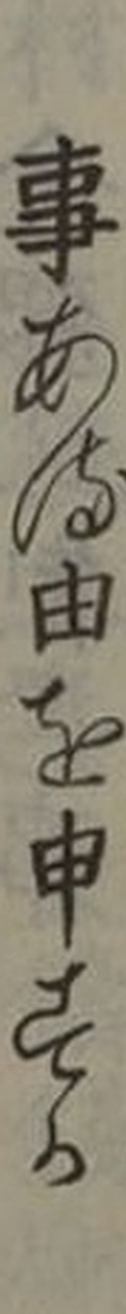事ある由を申すか

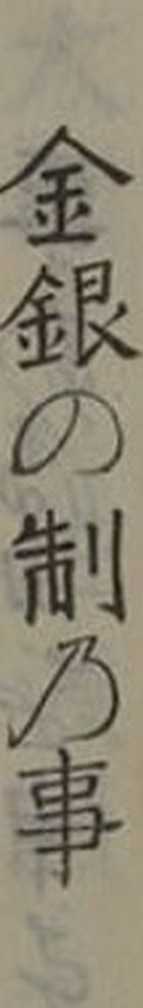金銀の制の事
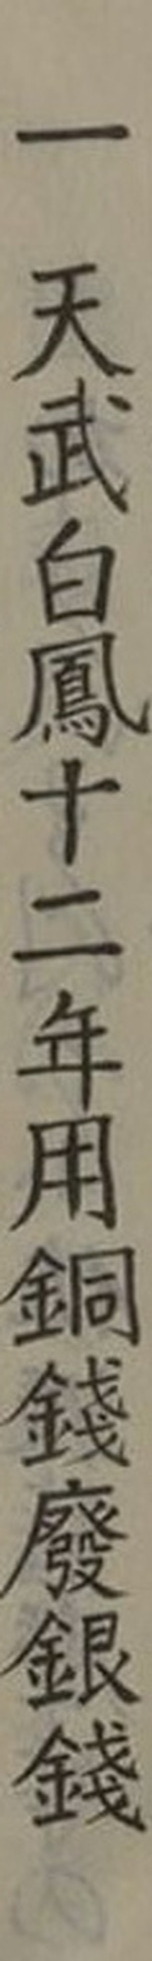一天武白鳳十二年用銅錢廢銀錢
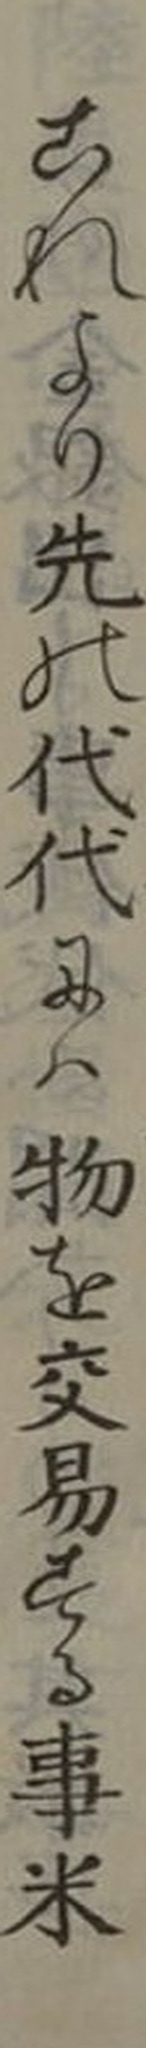これより先の代代には物を交易する事米
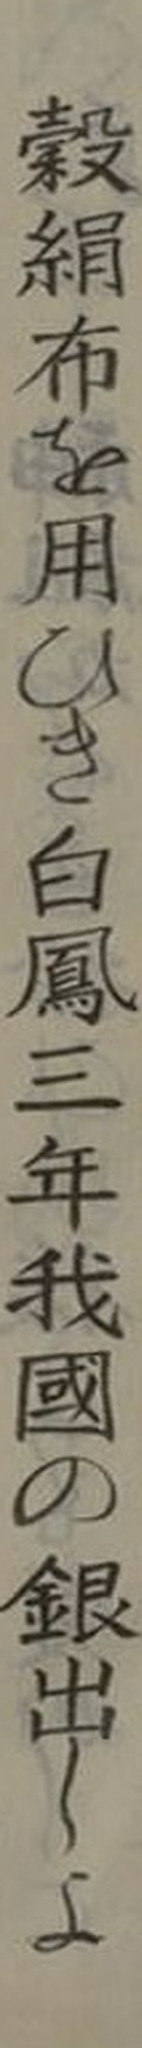穀絹布を用ひき白鳳三年我國の銀出しよ
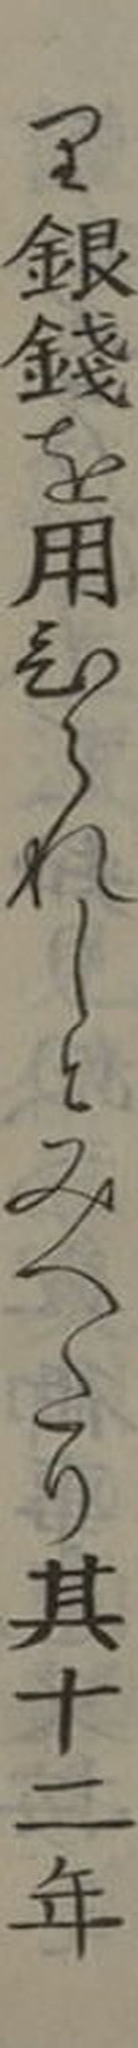り銀錢を用ひられしとみへたり其十二年
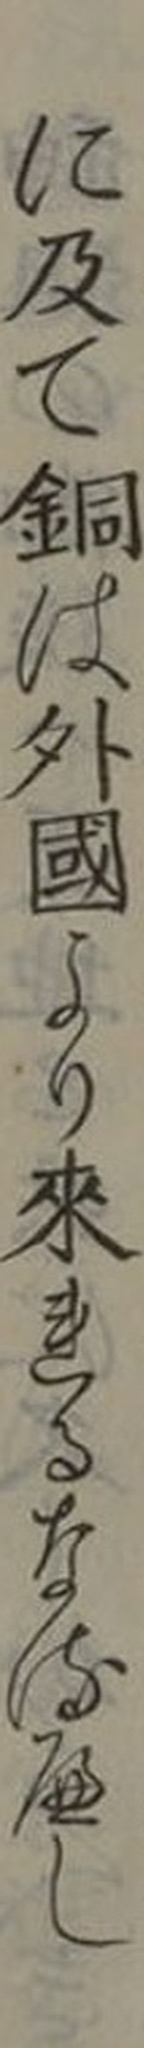に及て銅は外國より來れるなるへし
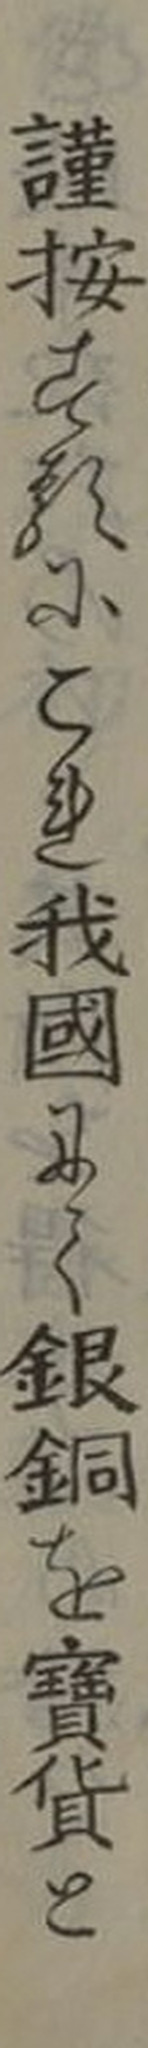謹按するにこれ我國にて銀銅を寶貨と
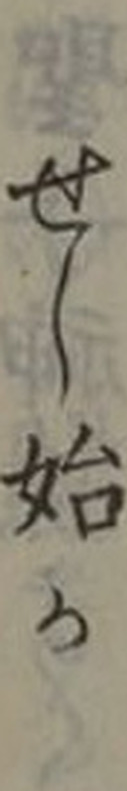せし始か
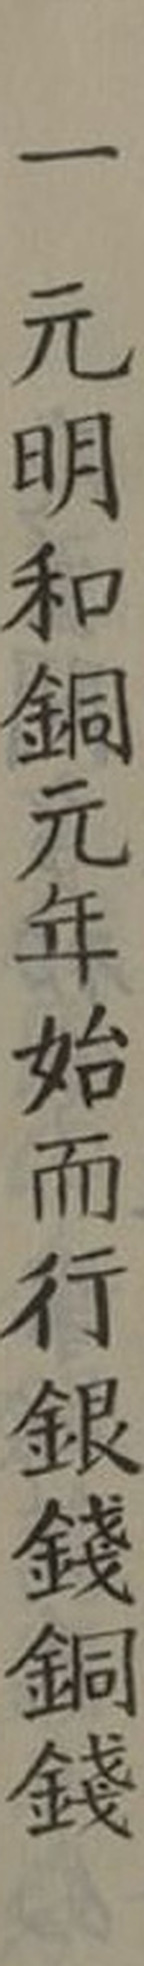一元明和銅元年始而行銀錢銅錢
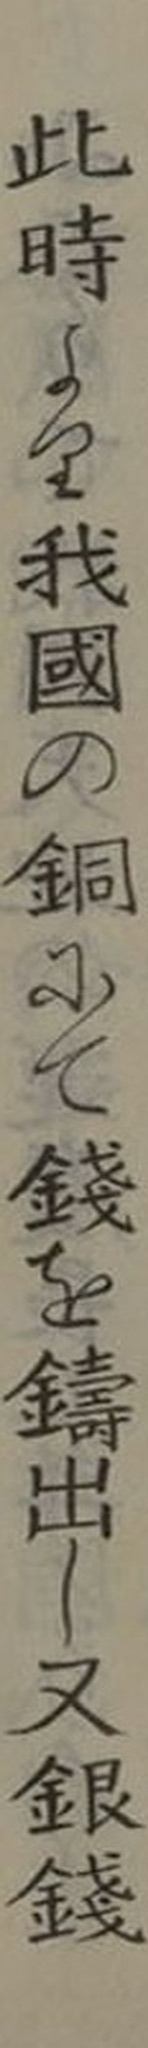此時より我國の銅にて錢を鑄出し又銀錢
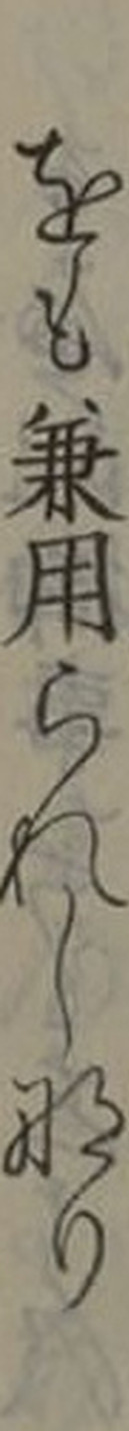をも兼用られしなり
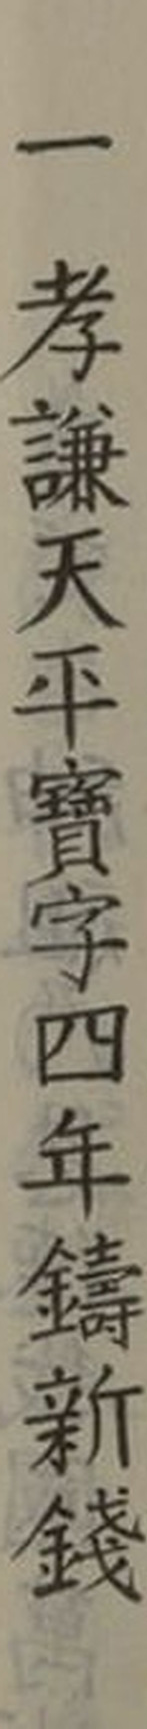一孝謙天平寶字四年鑄新錢
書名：骨董録
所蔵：University of the Ryukyus Library
